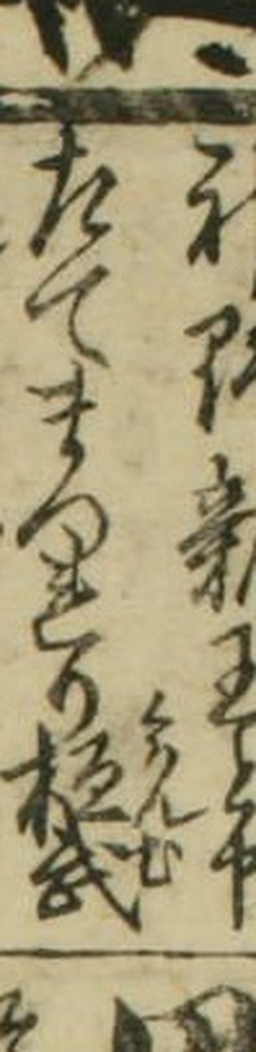たてまつれり桓武
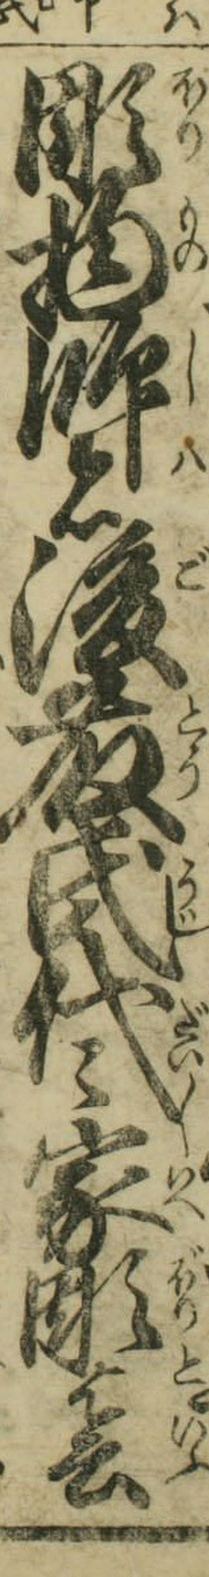彫物師者後藤氏代々家彫与云
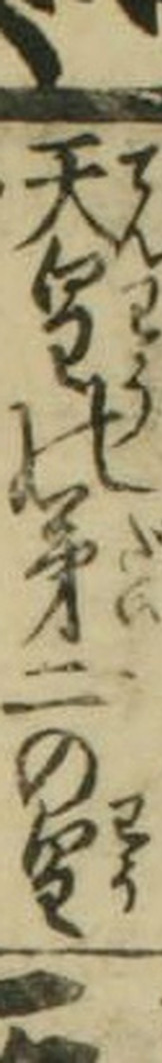天皇の第二の皇
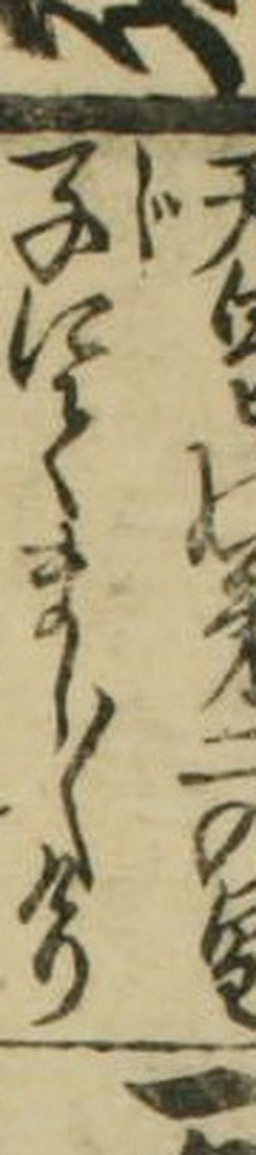子にてまし〳〵けり
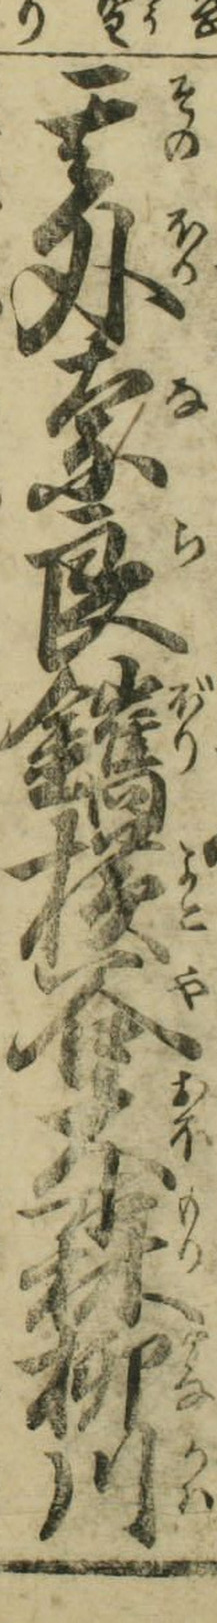其外奈良鐫横谷大森柳川
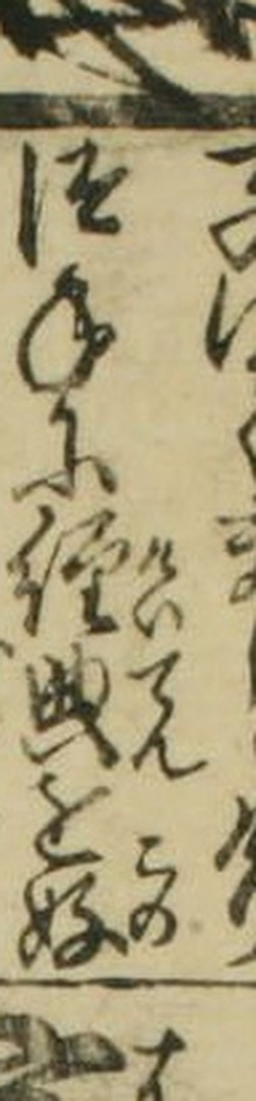つねに経典を好
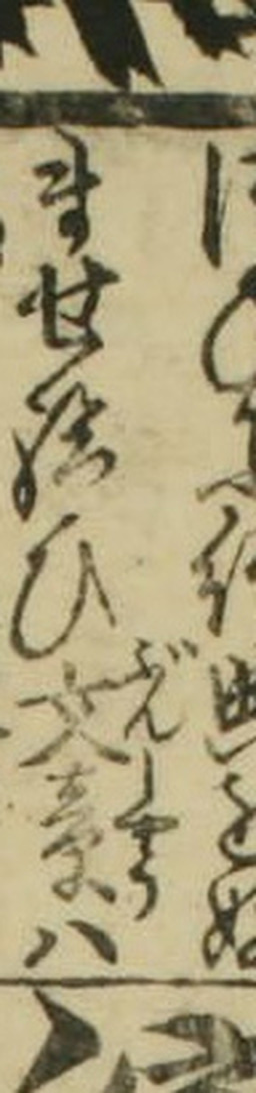ませ給ひ文章は
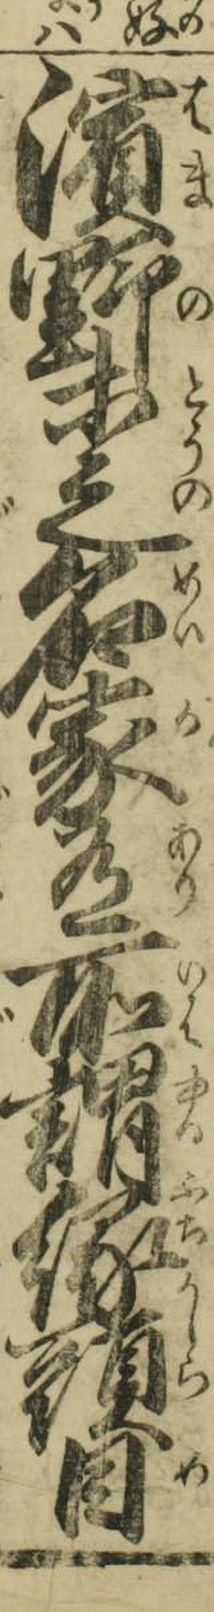濱野等之名家有所謂縁頭目
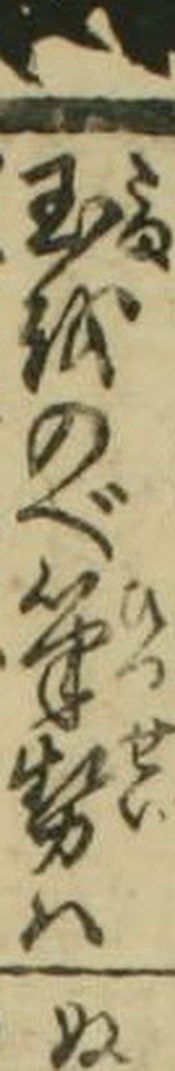玉をのべ筆勢は
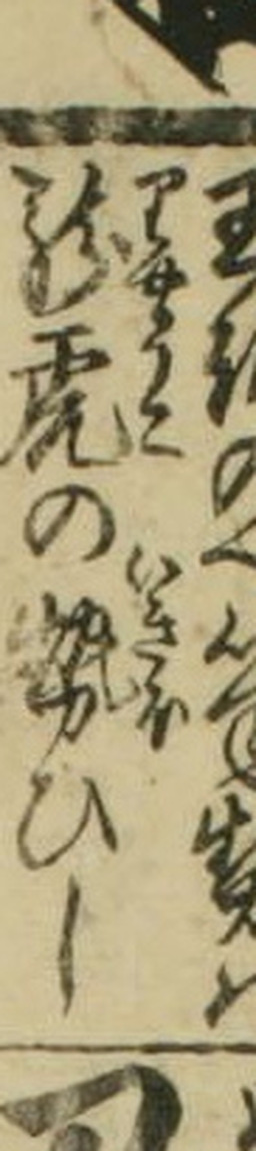龍虎の勢ひし
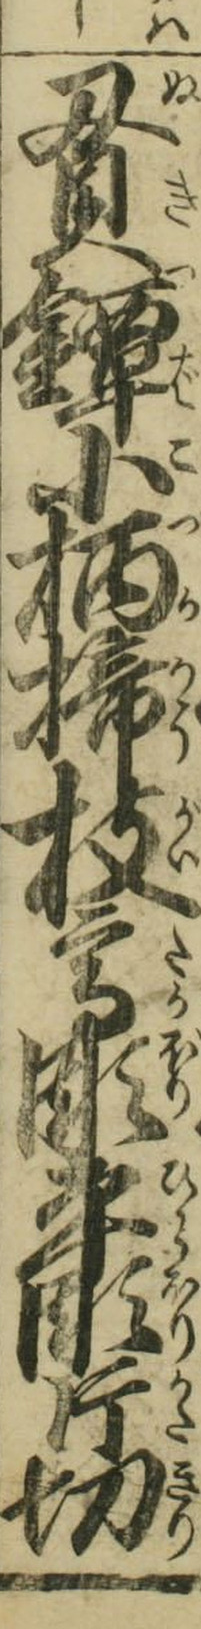貫鐔小柄揥枝高彫平彫片切
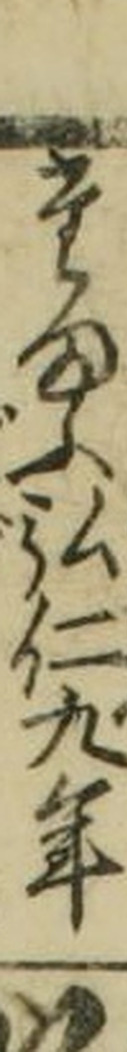たまふ弘仁九年
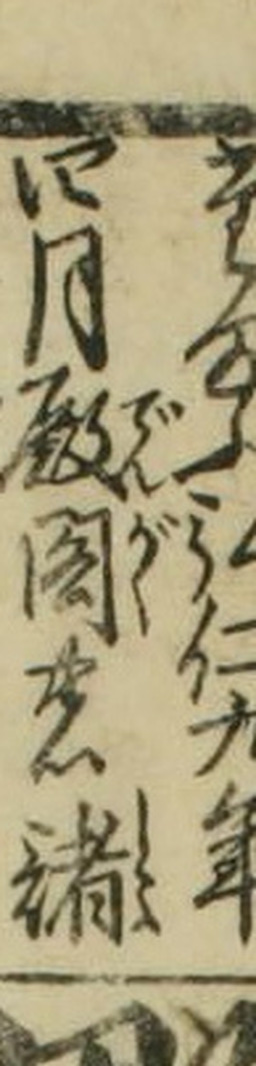四月殿閣の諸
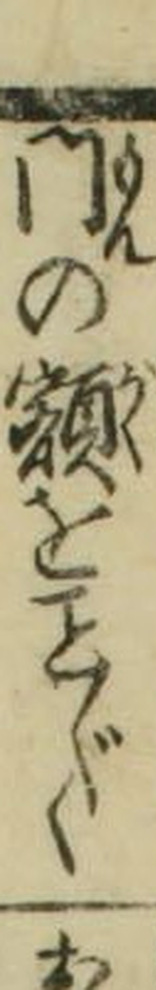門の額をこと〴〵く
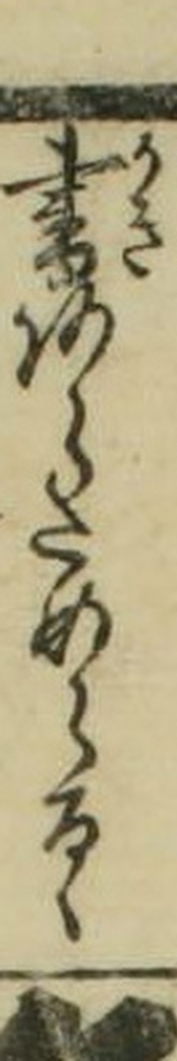書あらためらるゝ
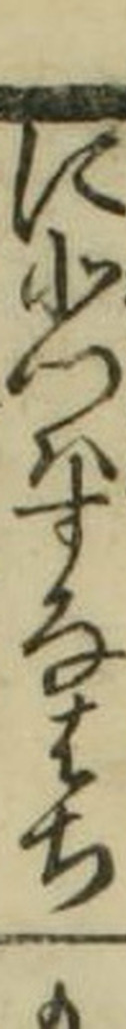に北門はすなはち
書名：増補職人往来
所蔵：東京学芸大学教育コンテンツアーカイブ
